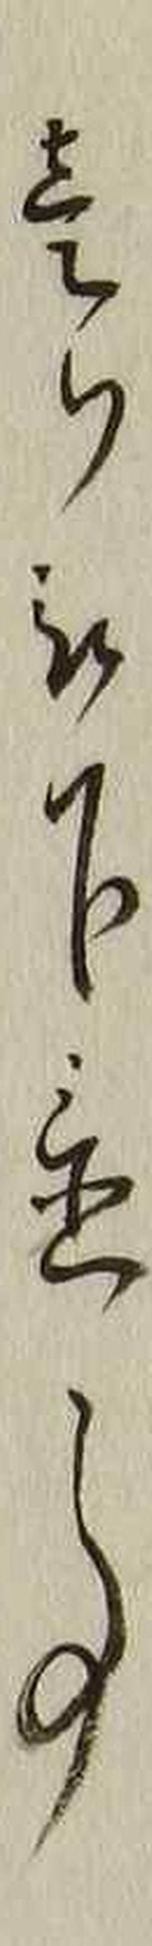壱ツ被下置候事
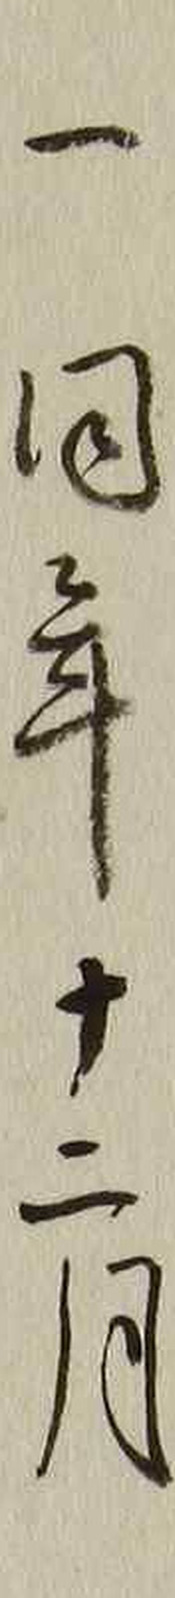一同年十二月
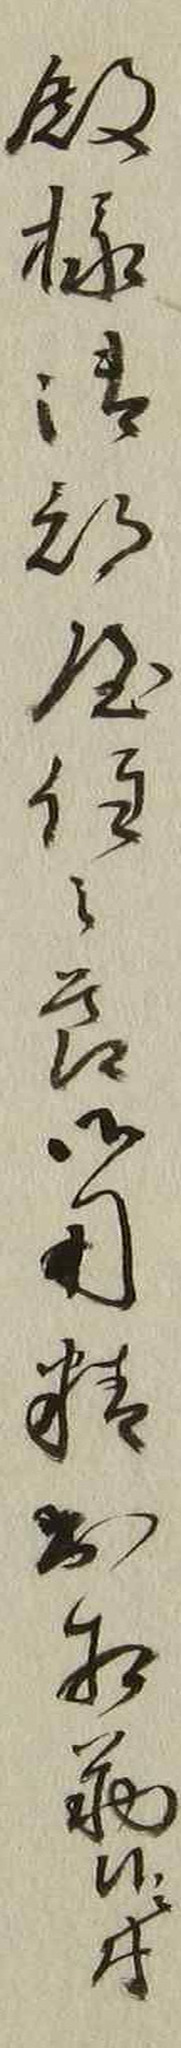殿様御部屋住之節御用精出相勤候ニ付
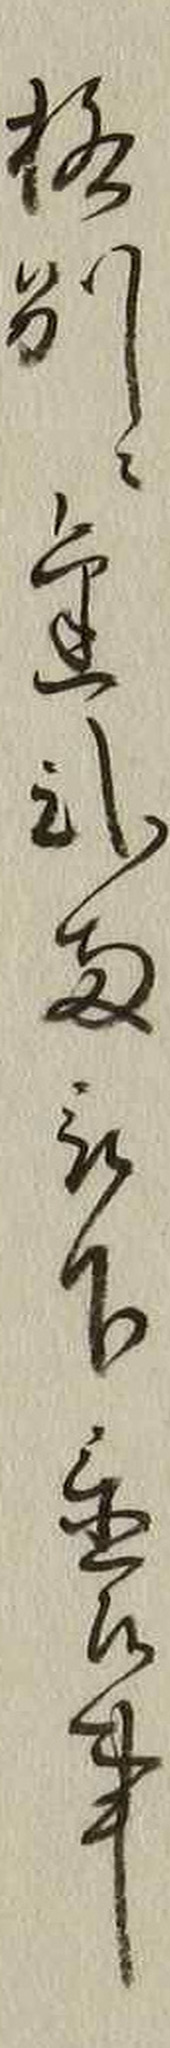格別ニ金弐両被下置候事
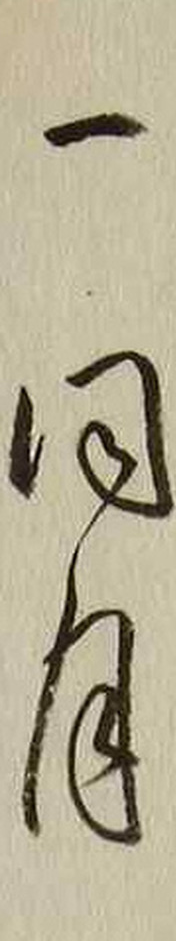一同月
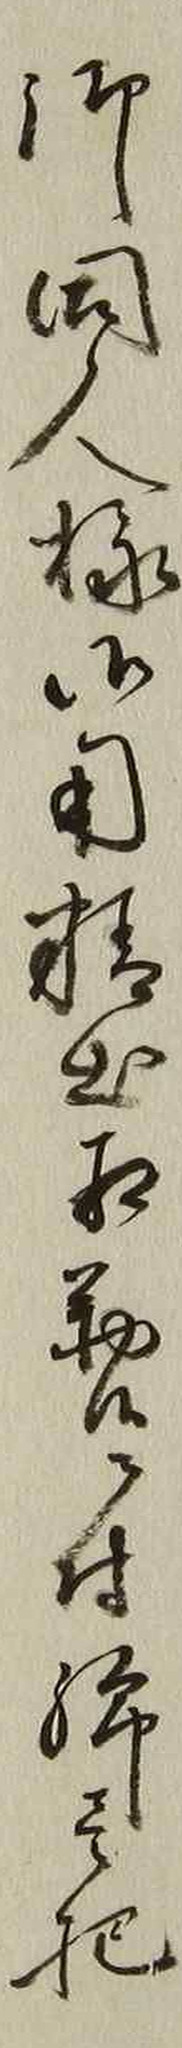御同人様御用精出相勤候ニ付綿壱把
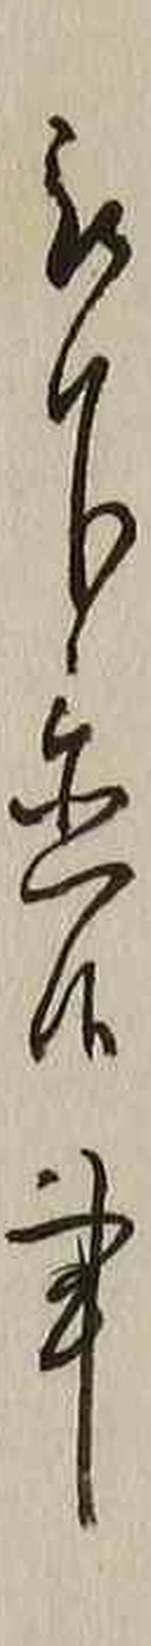被下置候事
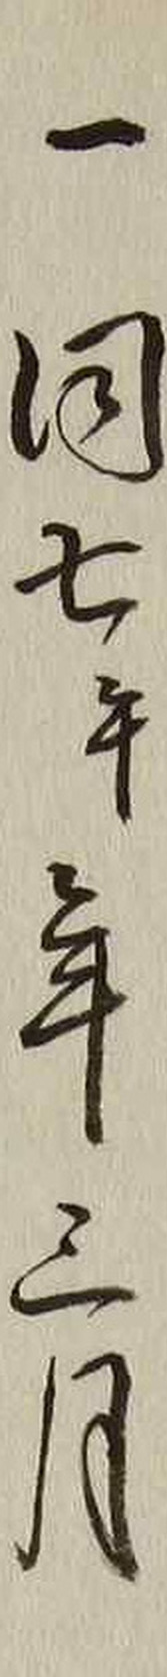一同七午年三月
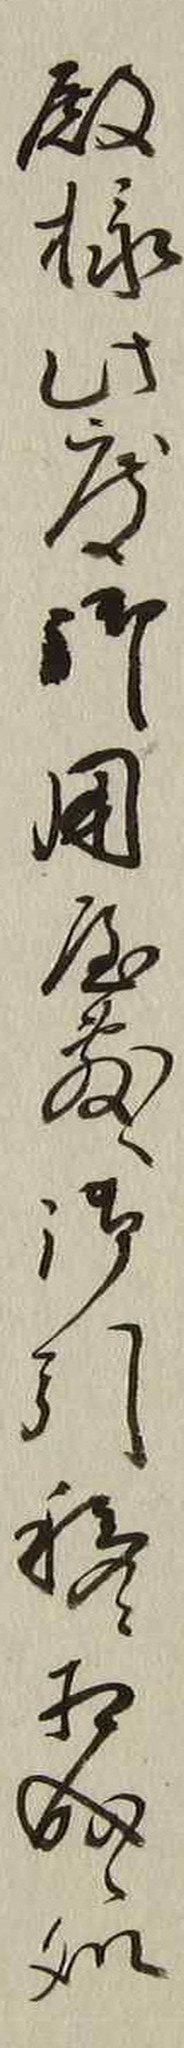殿様此度御用屋敷へ御引移ニ相成候処
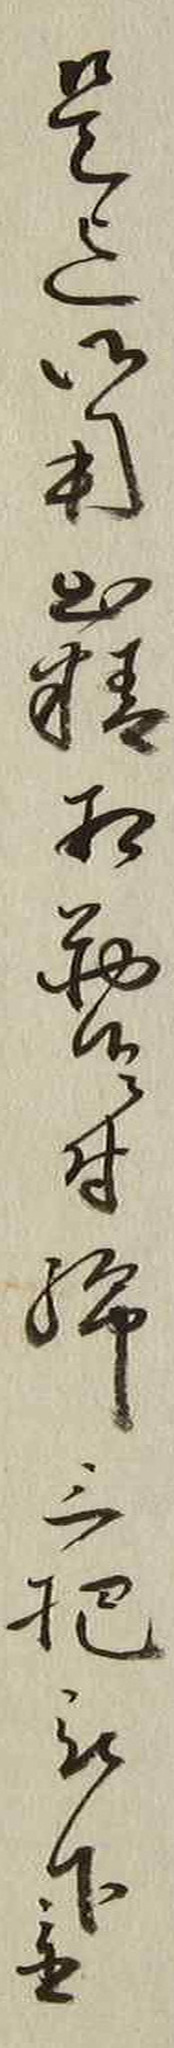是迄御用精出相勤候ニ付綿三把被下置
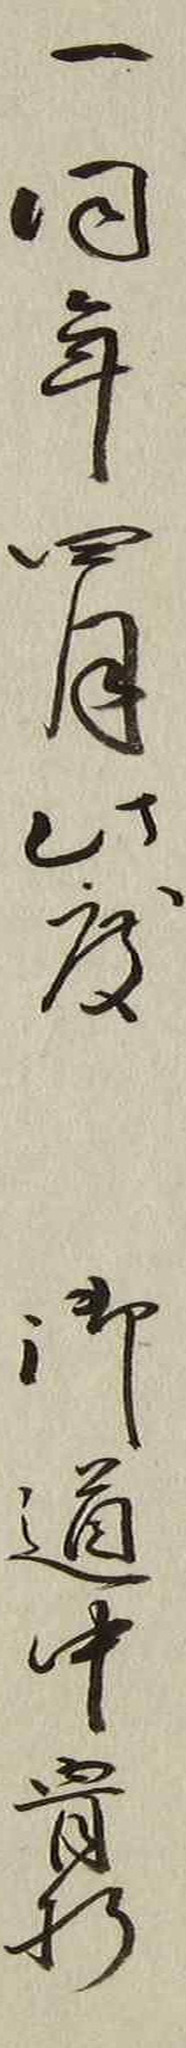一同年四月此度御道中骨折
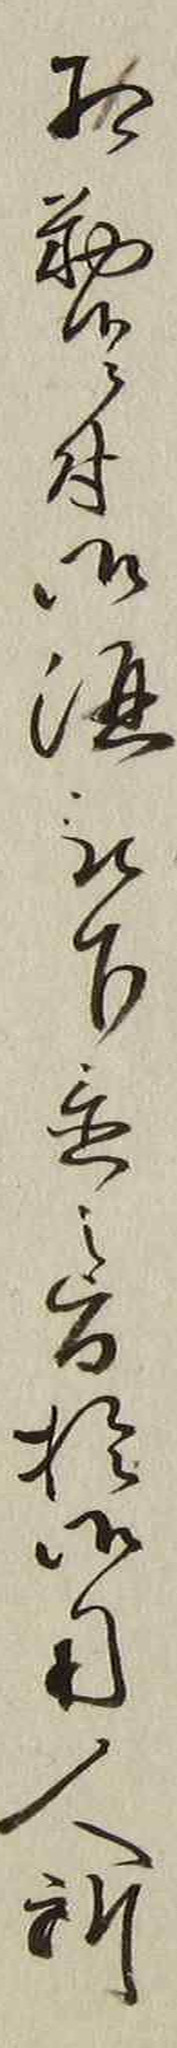相勤候ニ付御酒被下置候旨於御用人所
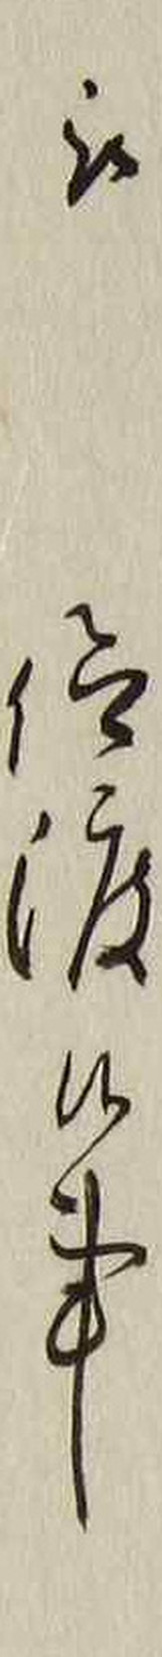被仰渡候事
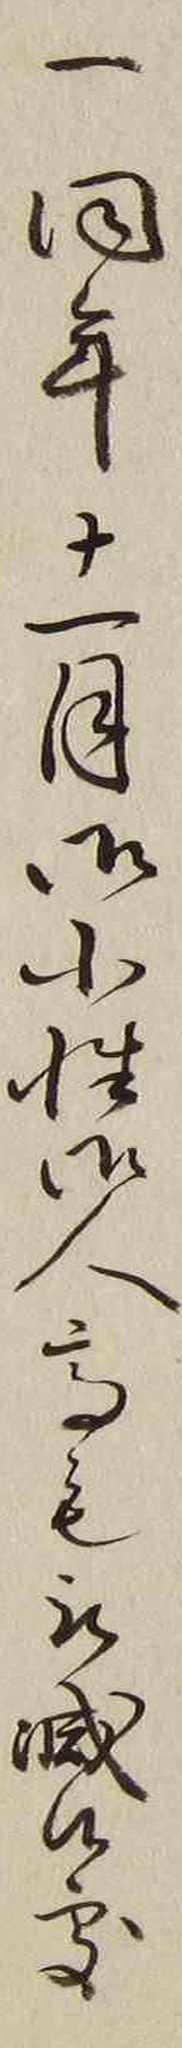一同年十一月御小性御人高も被減候処
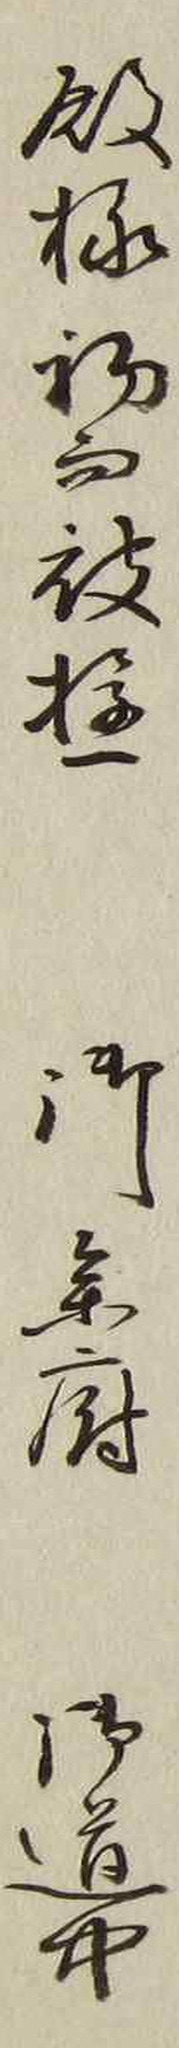殿様初而被遊御参府御道中

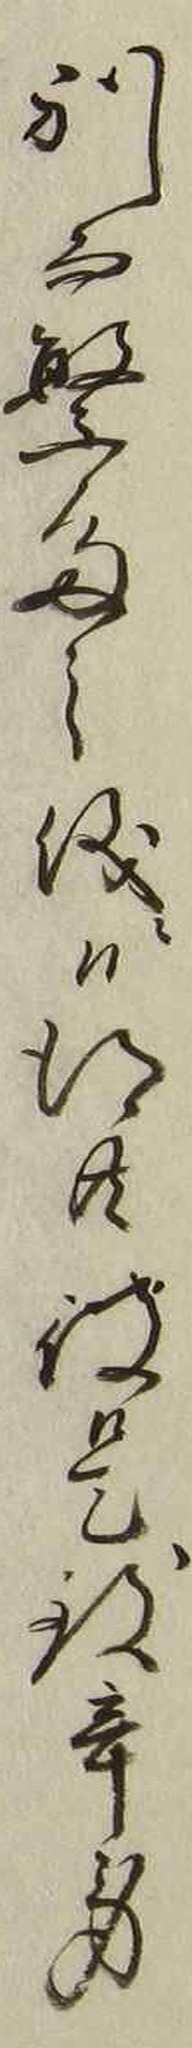別而繁多之儀ニ候得共彼是致辛身
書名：諸士系譜　巻之4　い之部4
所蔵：会津若松市立会津図書館
